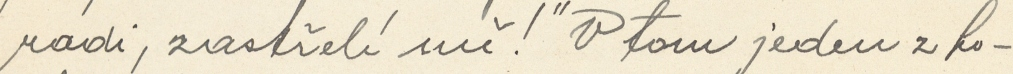rádi, zastřelí mě!“ V tom jeden z ho-
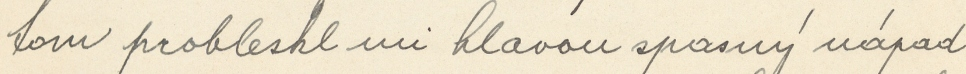tom probleskl mi hlavou spasný nápad.
